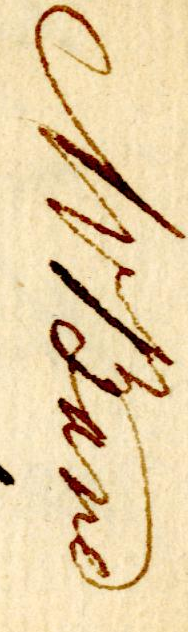M^r Bard
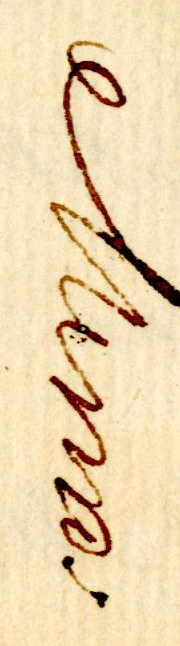Memos
